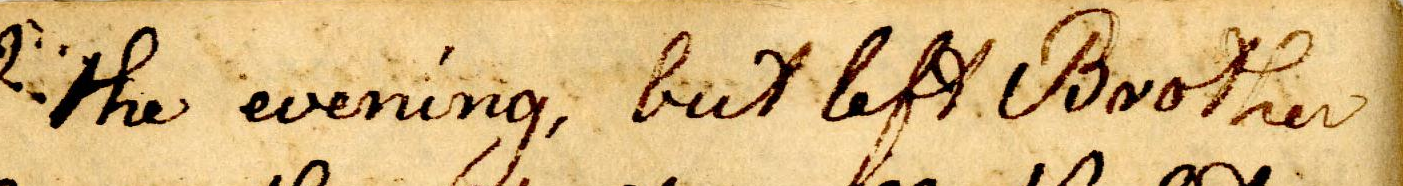the evening, but left Brother
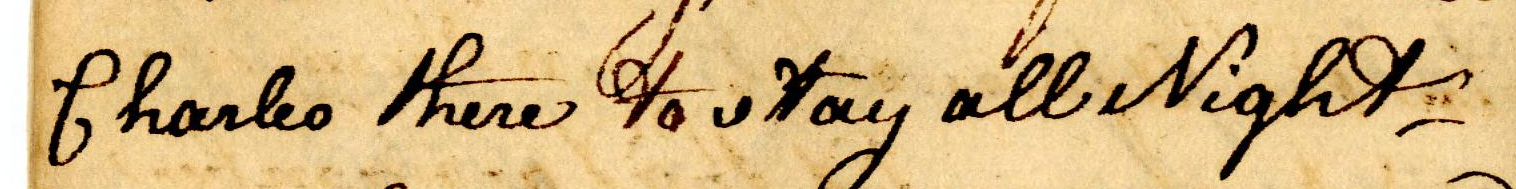Charles there to stay all Night
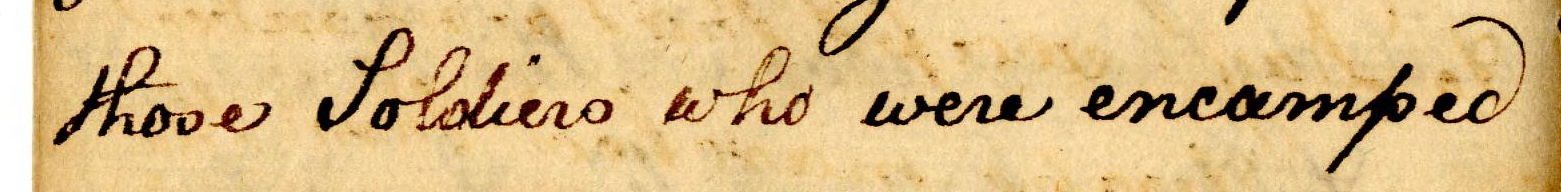those Soldiers who were encamped
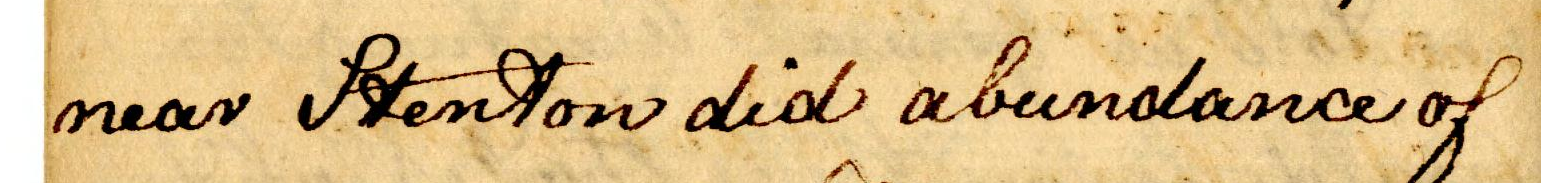near Stenton did abundance of
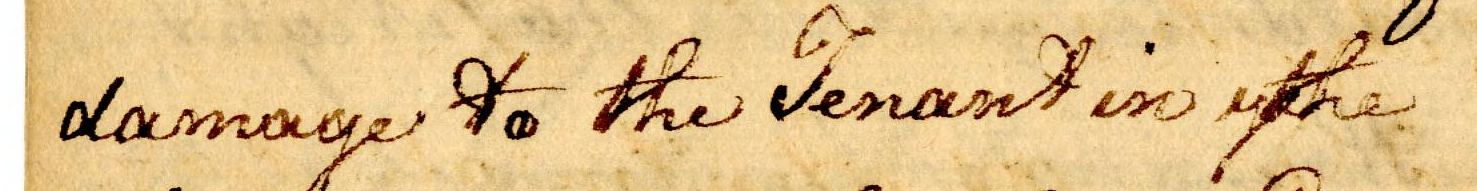damage to the Tenant in the
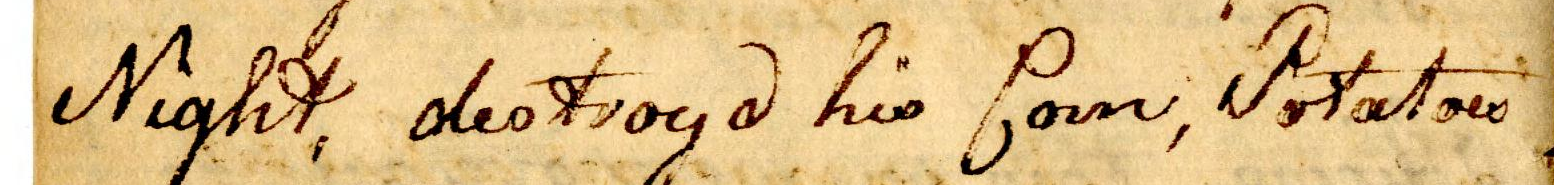Night, destroyd his Corn, Potatoes
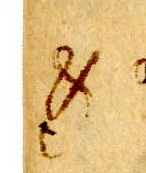&
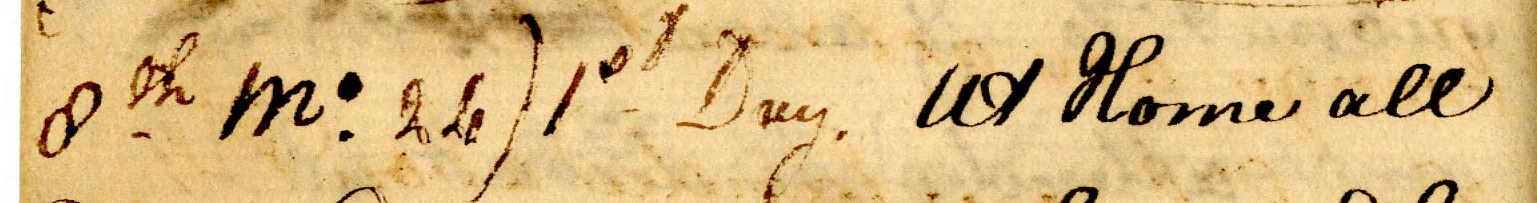8^th M^o 24 ) 1^st Day. At Home all
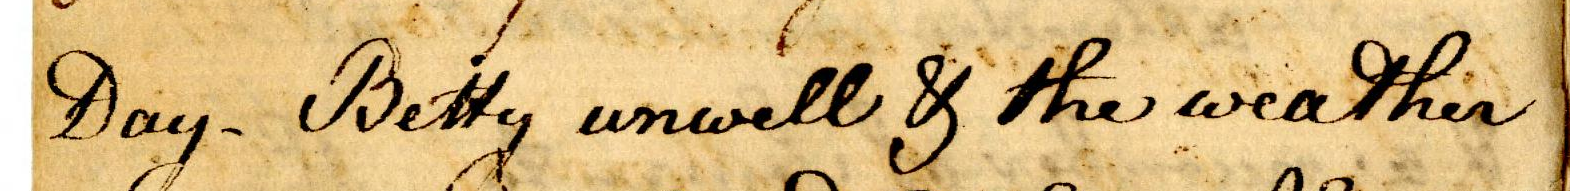Day. Betty unwell & the weather
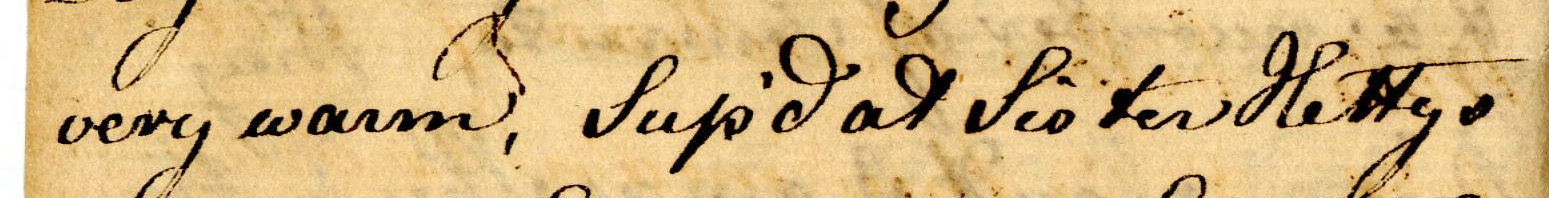very warm, Sup'd at Sister Hettys
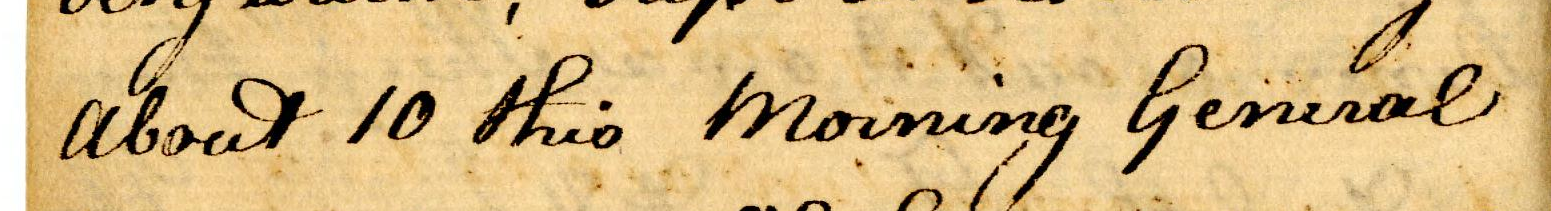About 10 this Morning General
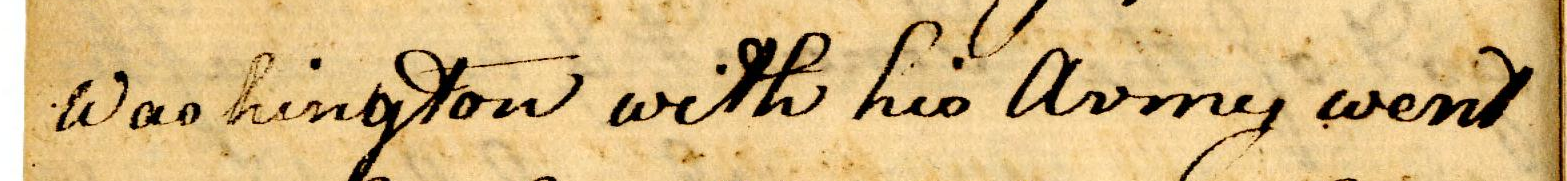Washington with his Army went
